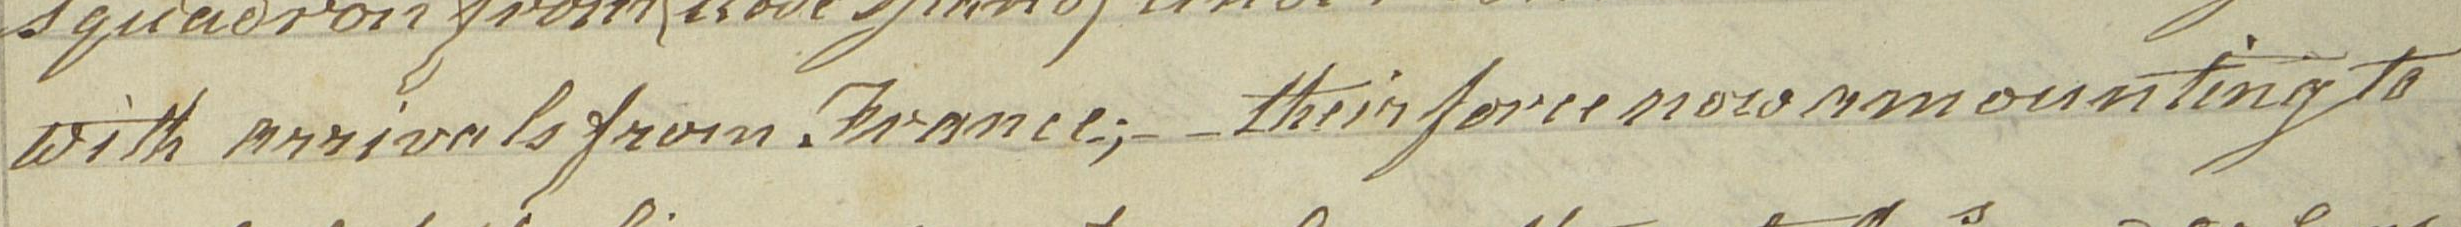with arrivals from France; their force now amounting to
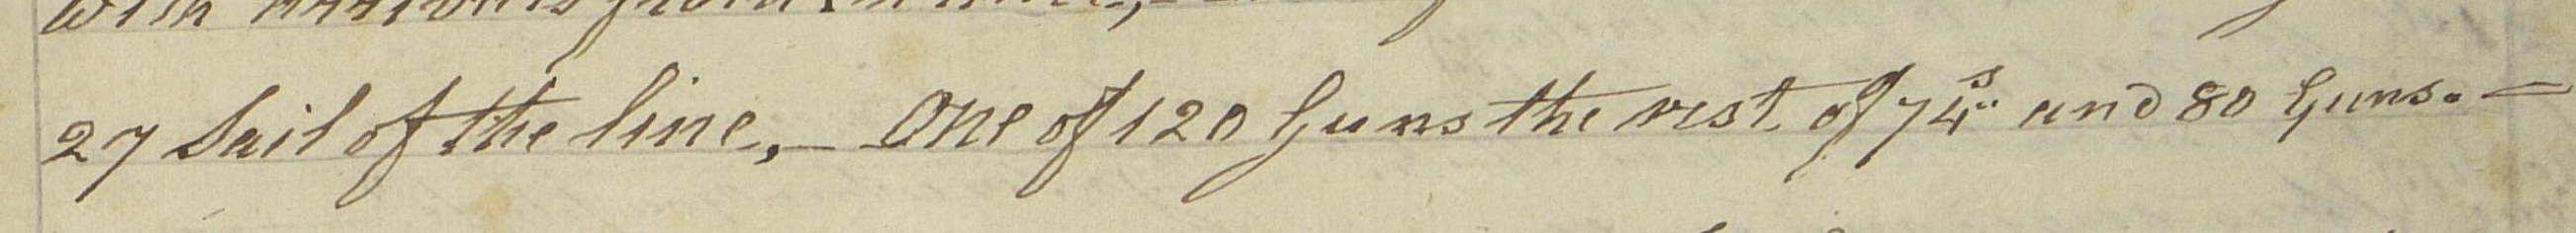27 Sail of the line, One of 120 Guns the rest of 74. und 80 Guns.
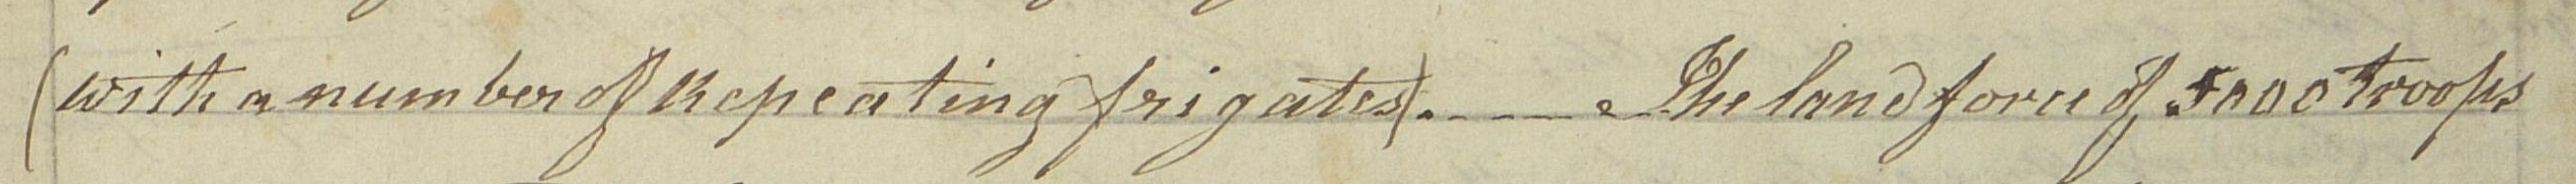(with a number of Repeating frigates). The land force of 4000 troops
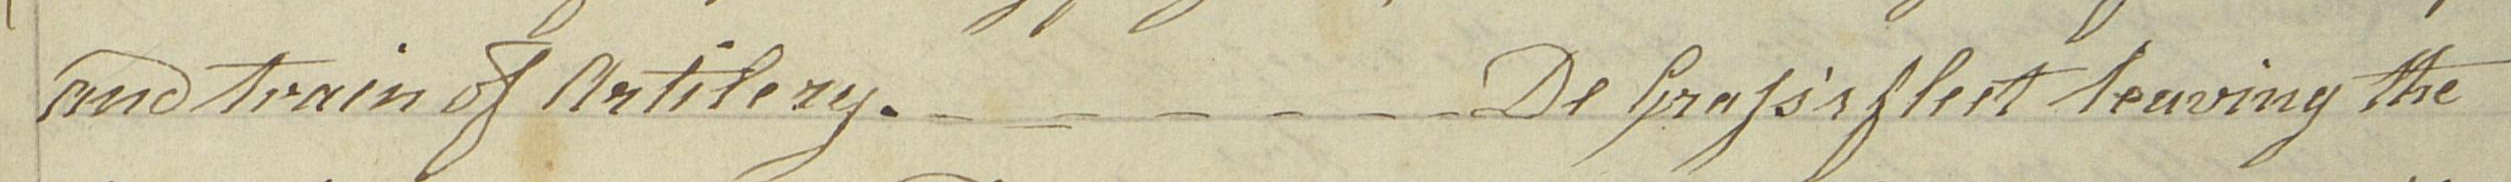and train of Artilery. De Grass's fleet leaving the
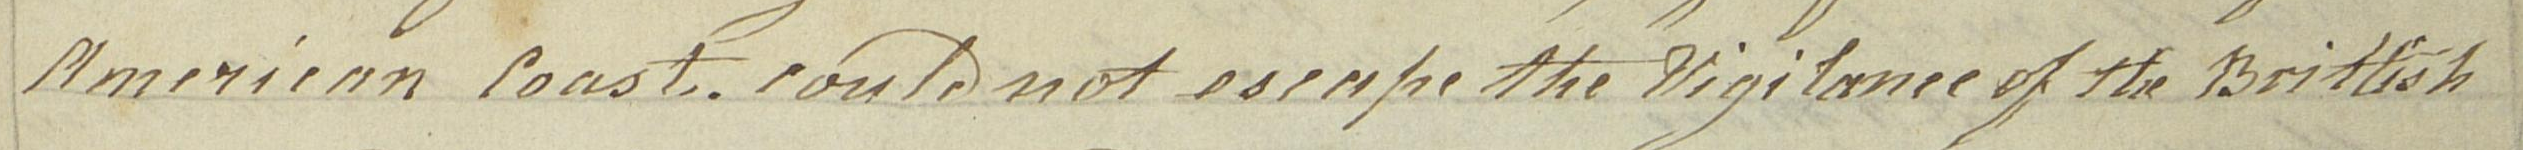American Coast. could not escape the Vigilance of the Brittish
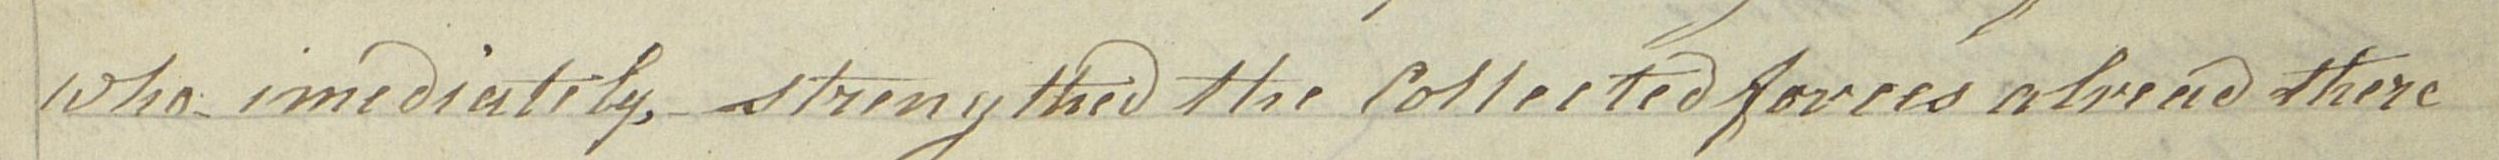who imediately, strengthed the Collected forces alread there
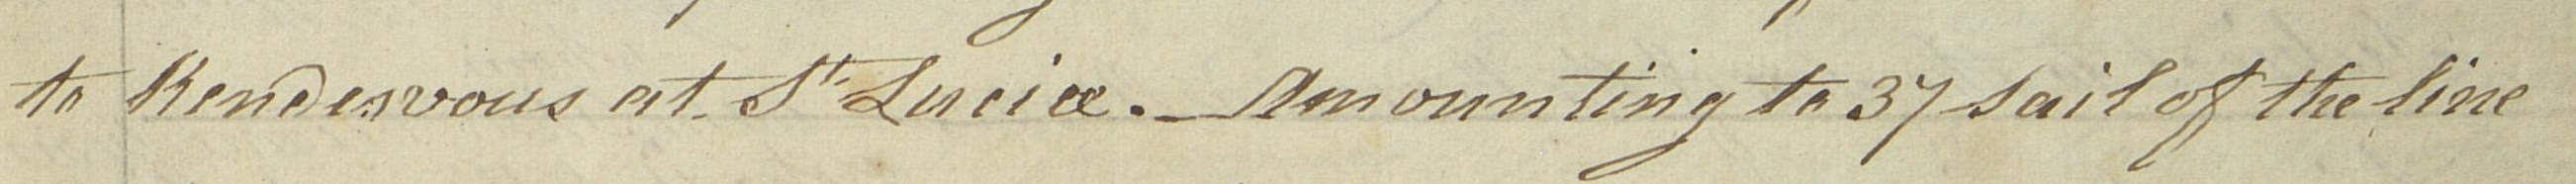to Rendesvous at S^t Lucia. amounting to 37 sail of the line
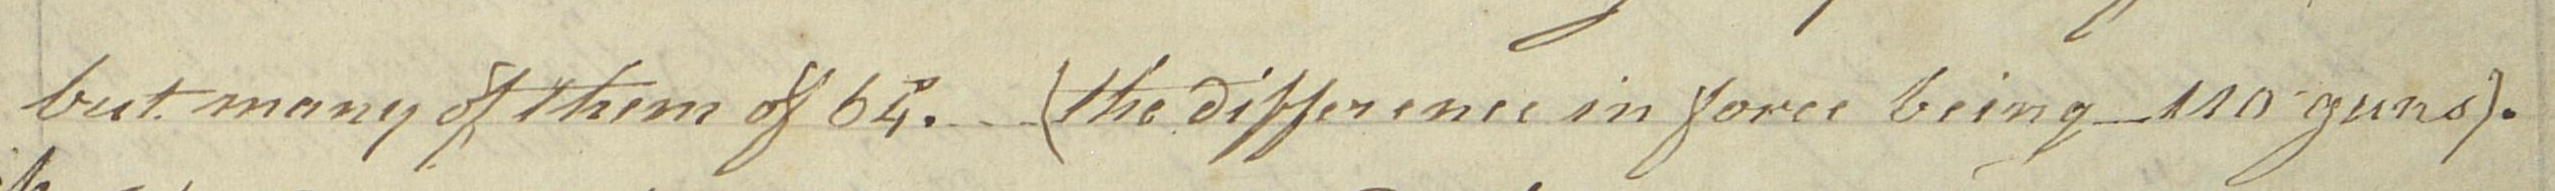but many of them of 64. (the difference in force being 110 guns).
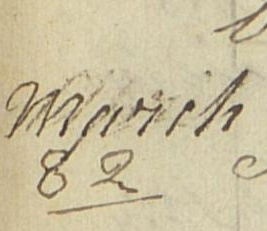March
